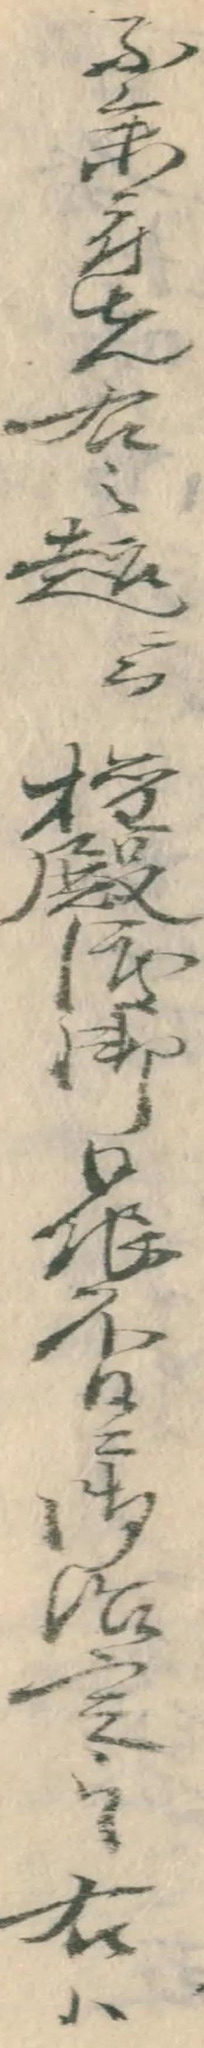不参ニ付先右之趣ニ而権殿渡御日限不日ニ御治定右ハ
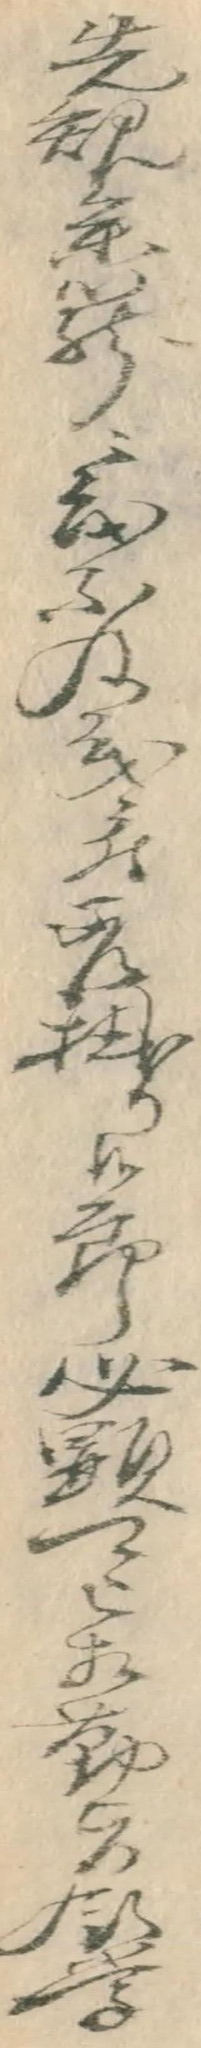先規参籠義不及義ニ付差掛り候節必顕可被相勤旨領掌

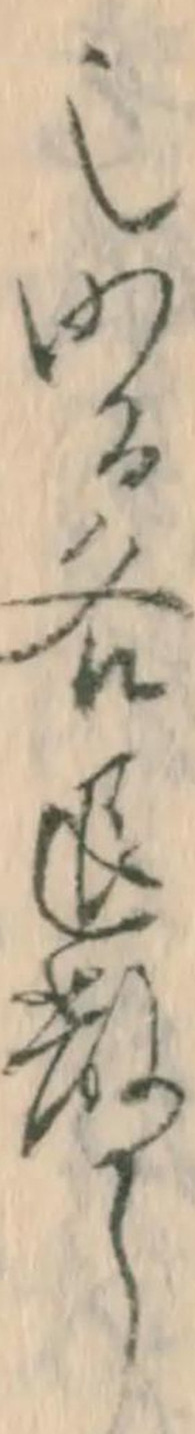也仍而各退散了
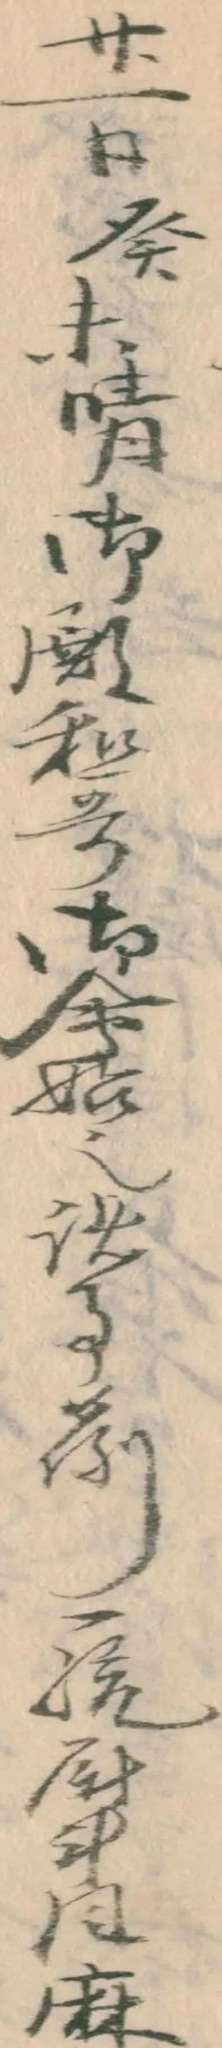廿一日癸未晴御殿和号御會始也諸事如例一統熨斗目麻
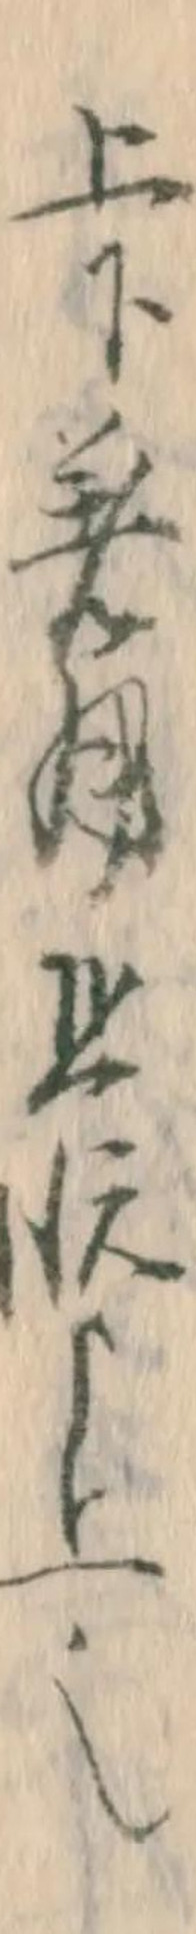上下着用恐悦申上也
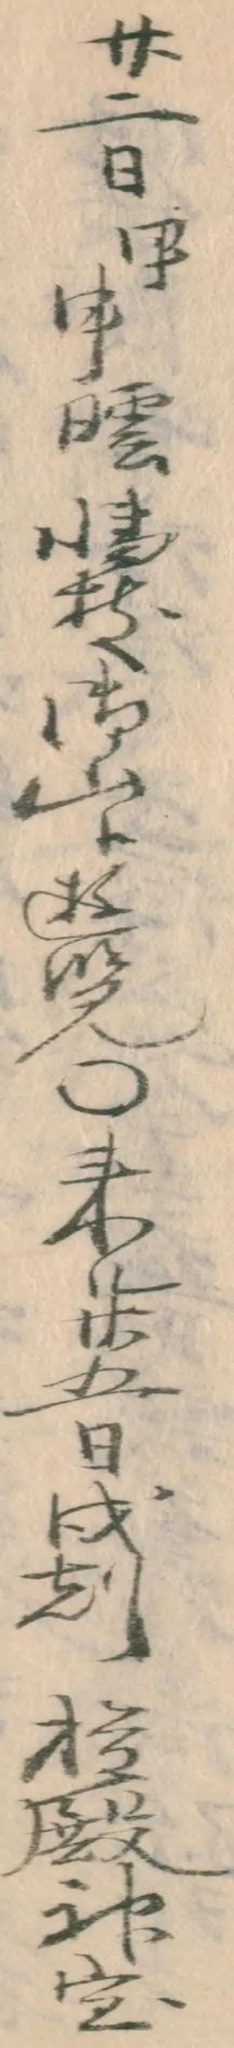廿二日甲申曇幡枝御山え遊覧〇来ル廿五日戌刻権殿神宝
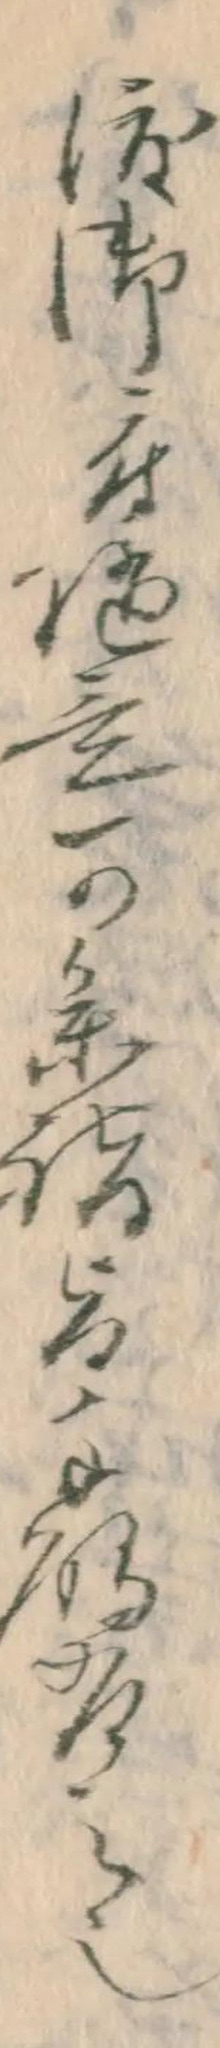渡御ニ付随意可参詣旨手觸有之候也
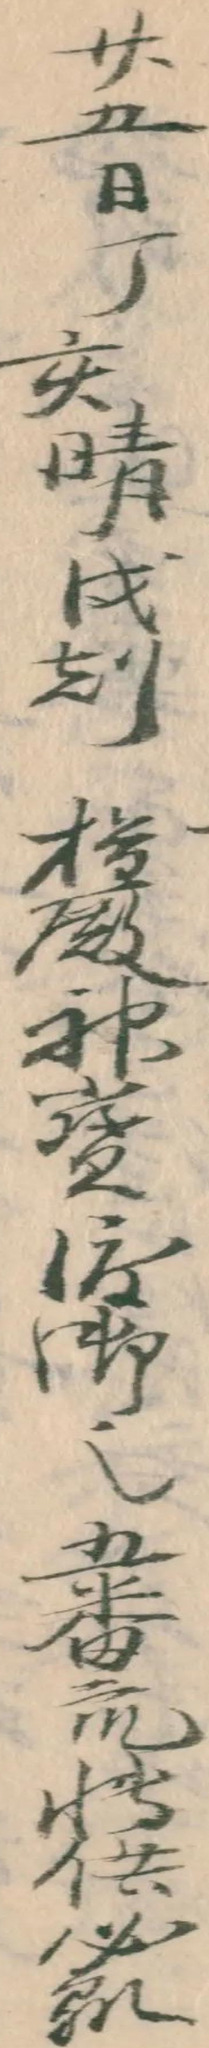廿五日丁亥晴戌刻権殿神寶渡御也五番衆轉供必顕
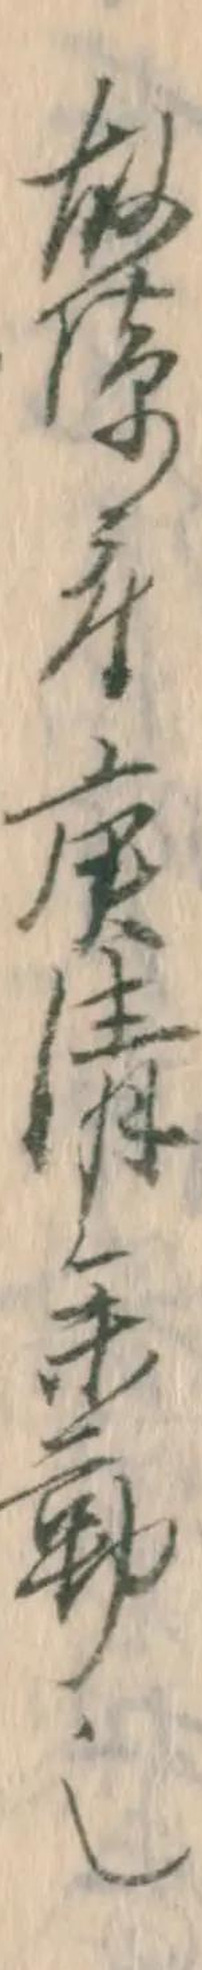故障ニ付庚清参動也
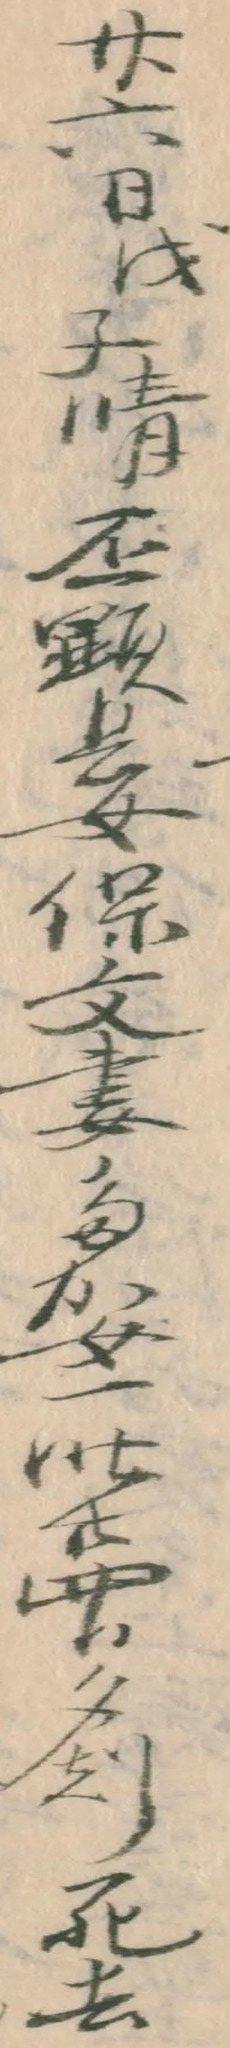廿六日戊子晴丕顕息女保文妻たか女一昨廿四日夕刻死去
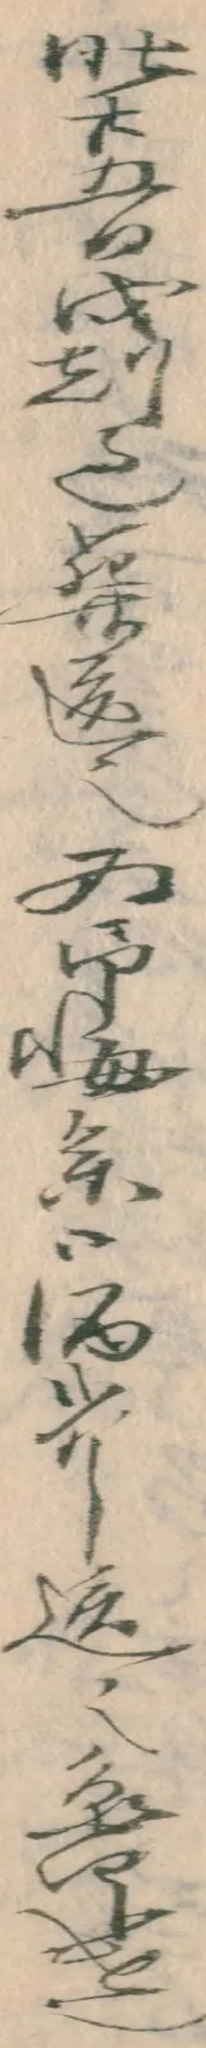昨廿五日戌刻過葬送也為即悔参御酒弐升送之亀四郎遣也
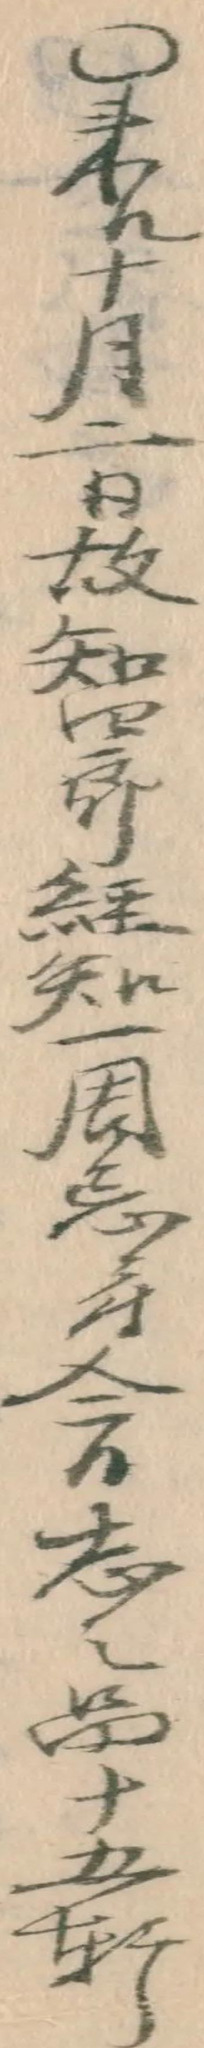〇来ル十月二日故知四郎経知一周忌ニ付今日志之品十五軒
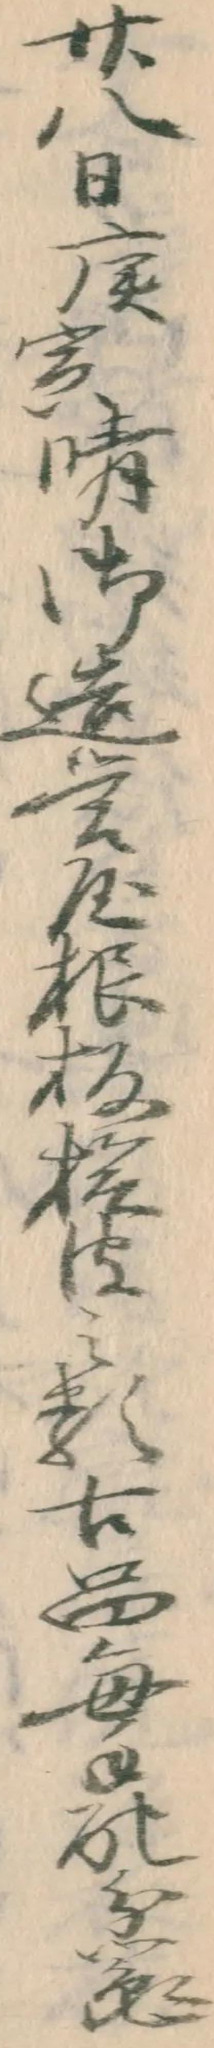廿八日庚寅晴御造営屋根板檜皮之類古品毎御配分鬮
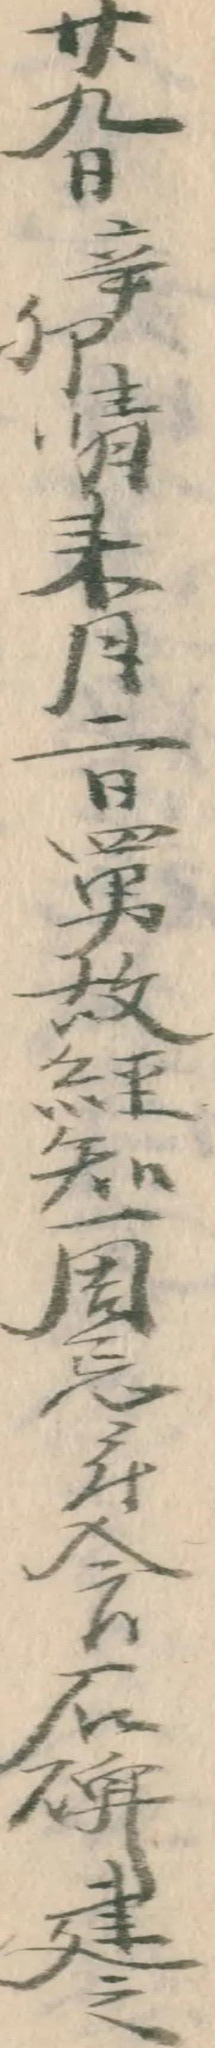廿九日辛卯晴来月二日四男故経知一周忌ニ付今日石碑建之
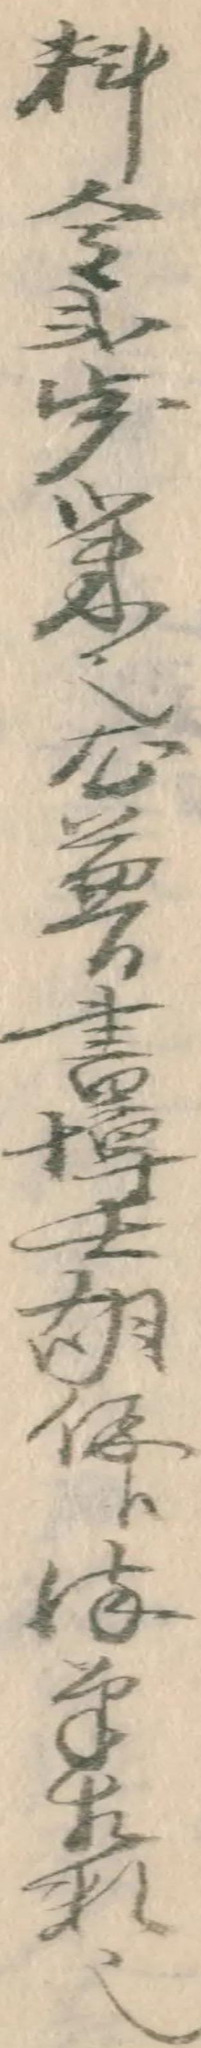料金弐歩弐朱也尤兼而書博士胡保え筆相頼也
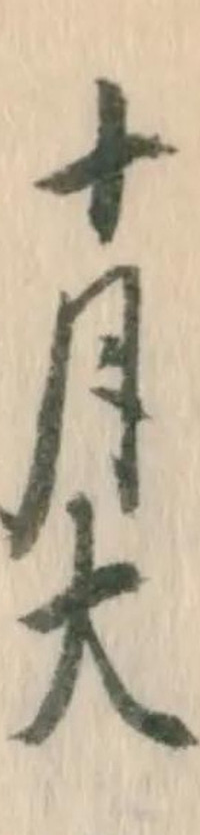十月大
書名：賀茂社記録. 第66冊
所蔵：国立国会図書館 National Diet Library, JAPAN
